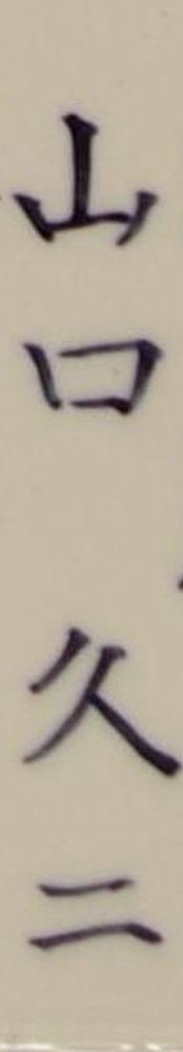山口久二
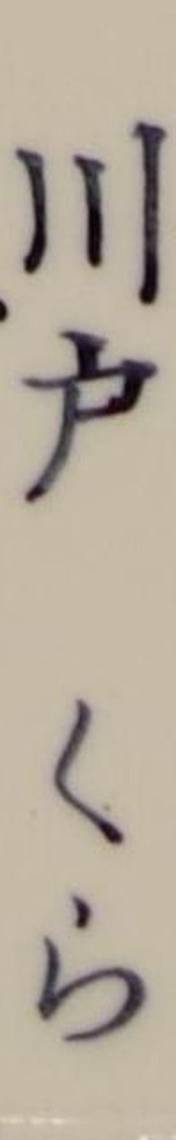川戸くら
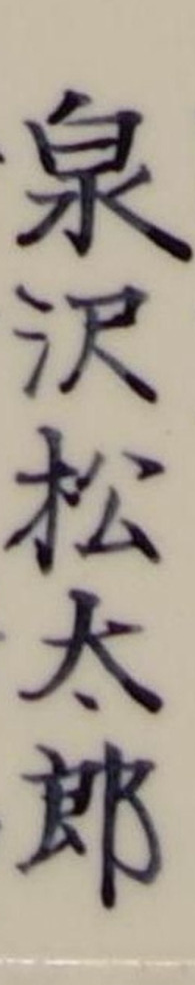泉沢松太郎
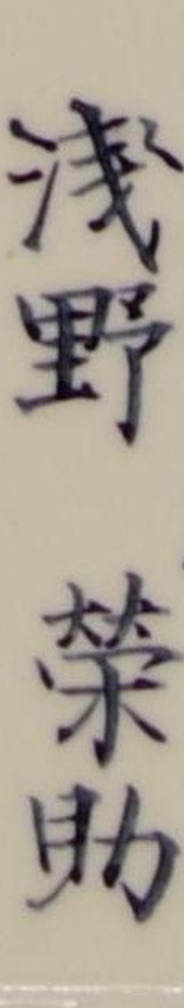浅野榮助
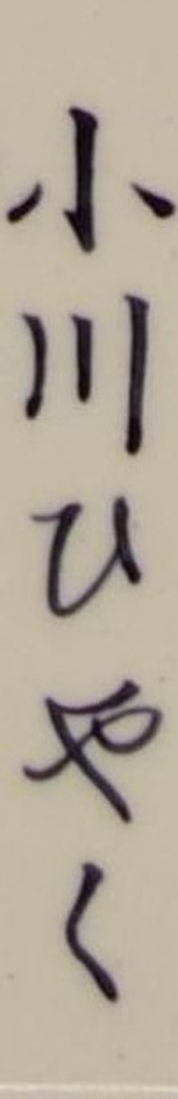小川ひやく
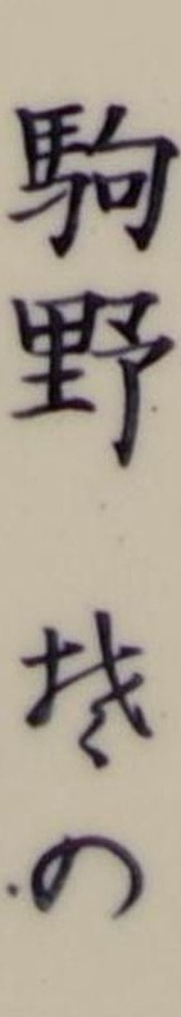駒野その
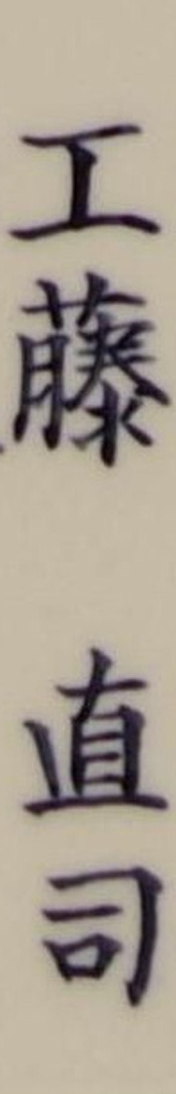工藤直司
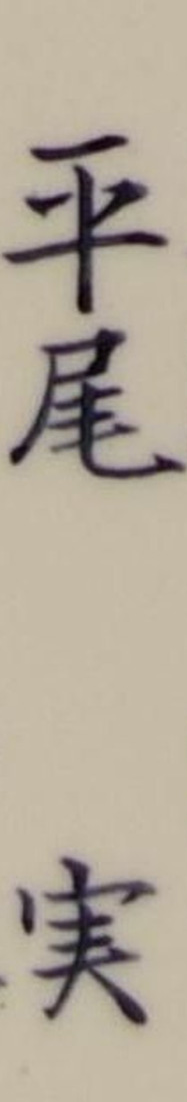平尾実
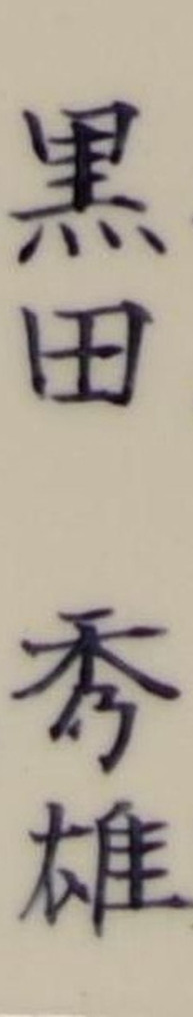黒田秀雄
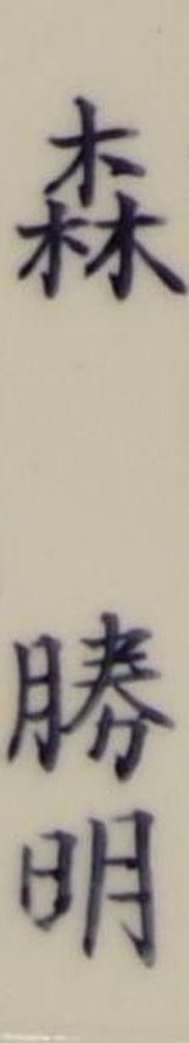森勝明
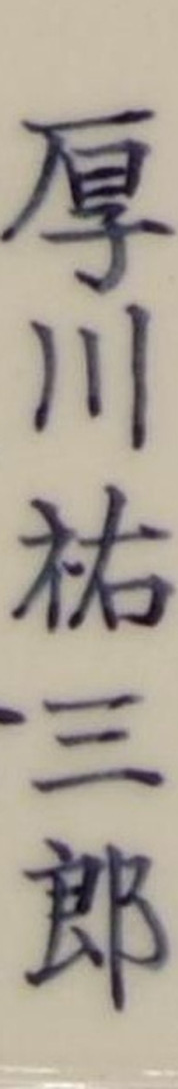厚川祐三郎
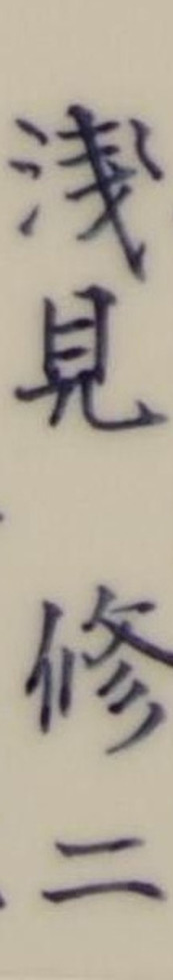浅見修二
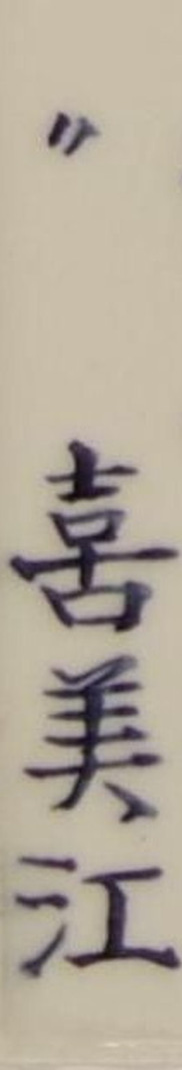喜美江
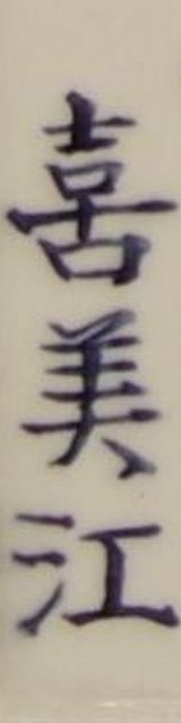喜美江

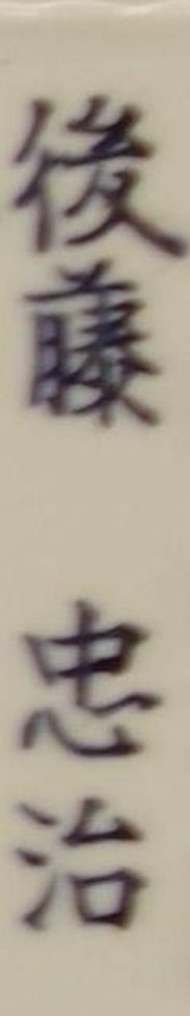後藤忠治
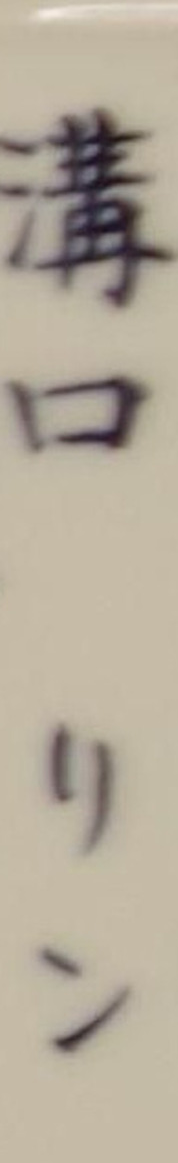溝口リン
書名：M~S
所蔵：高野山金剛峯寺
